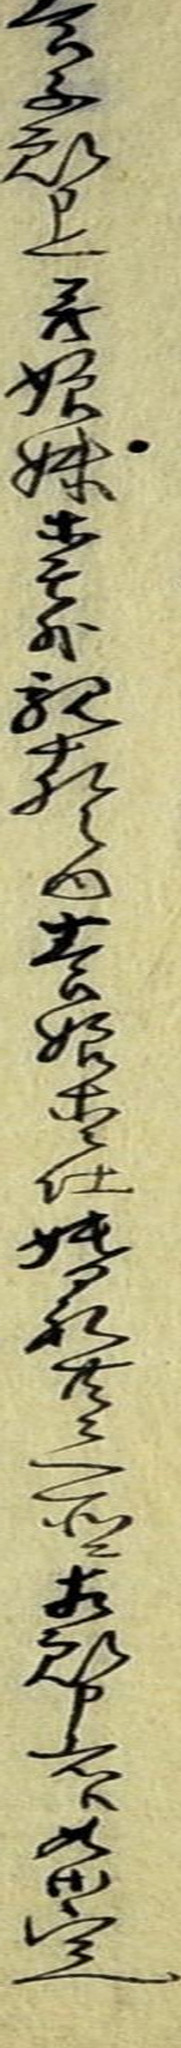〇養子願申上并娘妹等其外親類之内養娘等ニ仕婚礼共ニ一所ニ相願申者ハ如御定
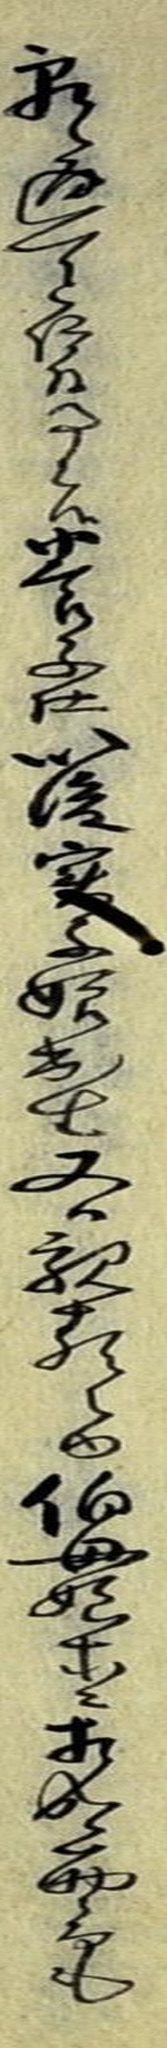願之通可被仰付事ニ候養子仕以後実子娘出生又ハ親類之内伯母姪等ニ相成候筋ニ而も
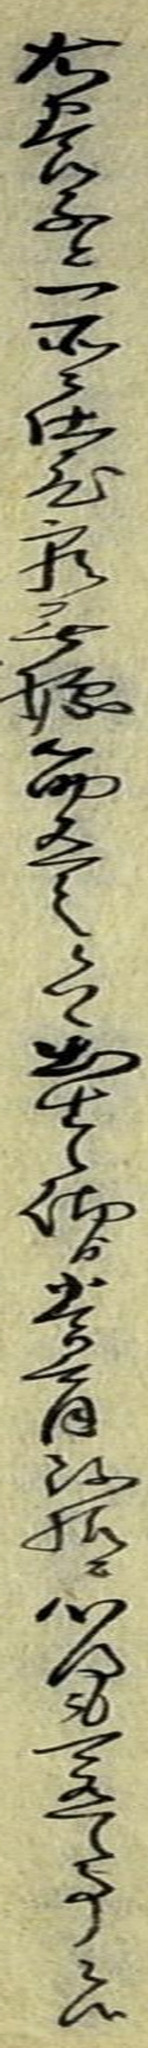右養子と一所ニ仕度願無拠筋有之候ハヽ出生之砌ゟ養育致様ニ心得も可有之事ニ候
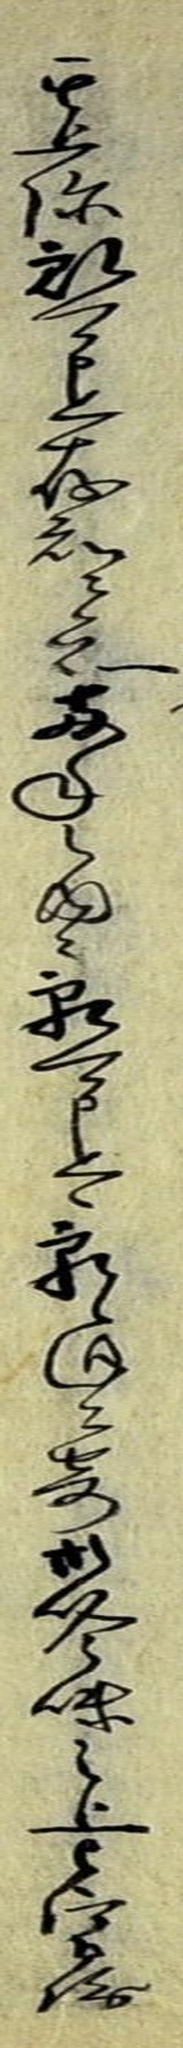其上弥願可申上存知ニ候ハヽ一両年之内ニ願可申上候願之趣ニ寄御吟味之上被仰付儀
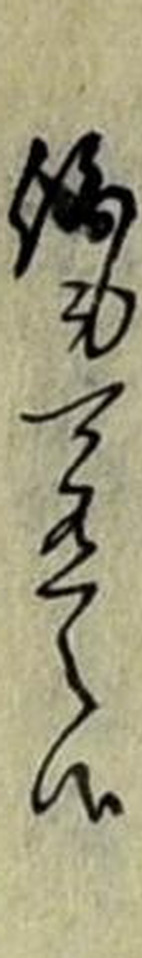も可有之候
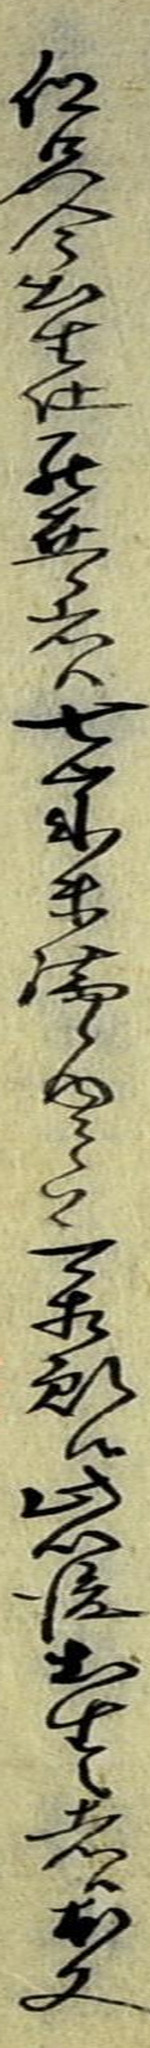但只今出生仕罷在候者ハ七歳未満之内ニ候ハヽ可相願候此以後出生之者ハ本文
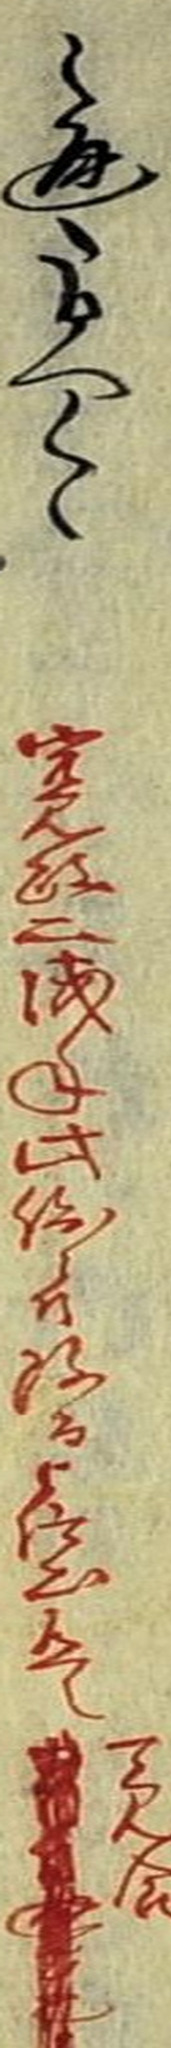之通たるへく候寛政二戌年此儀ニ付改而被仰出有之可見合
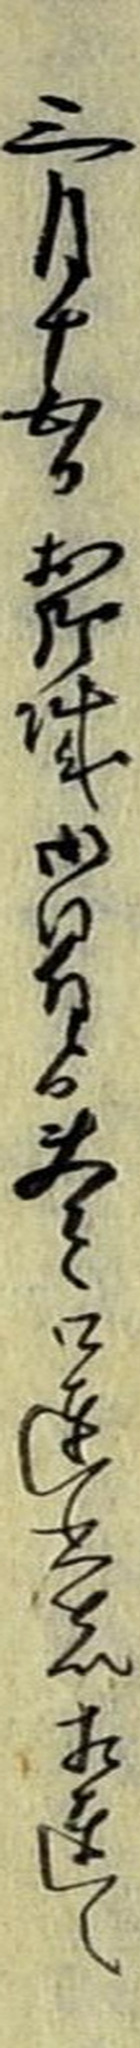三月十五日於御城御目付ゟ夫々へ口達書を以相達之
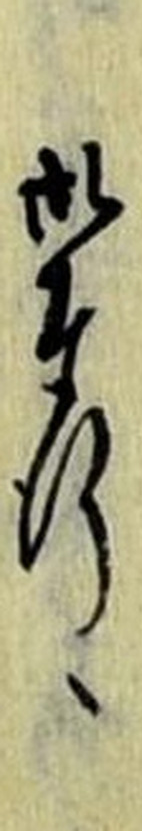御奉行へ
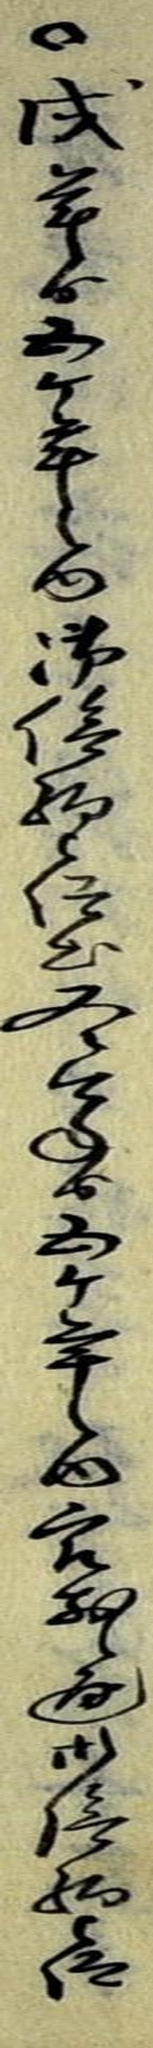〇戌年ゟ五ケ年之内御倹約被仰出又々今年ゟ五ケ年之内最前之通御倹約被仰
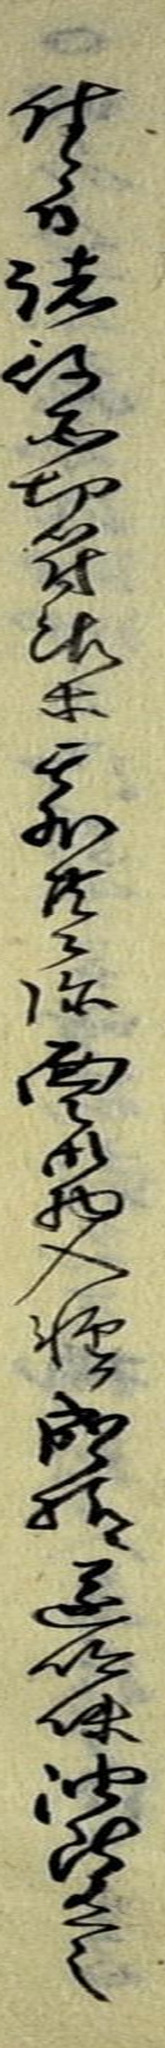付候ニ付諸役所切符銀等其外共ニ弥面々御物入軽ク成候様ニ遂吟味油断有之
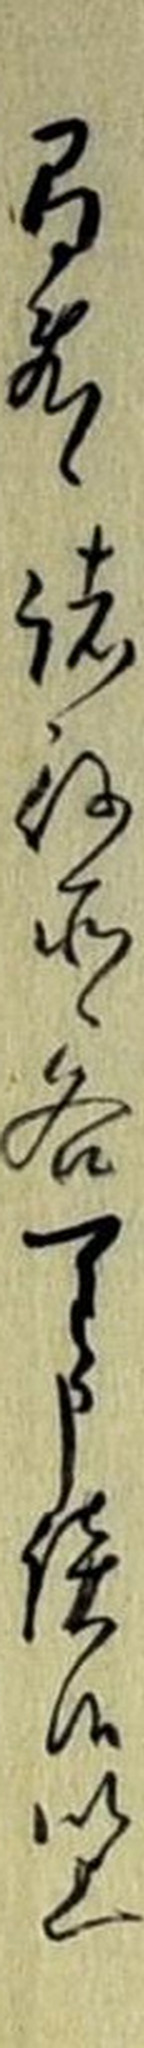間敷候諸役所へ各可被申談候以上
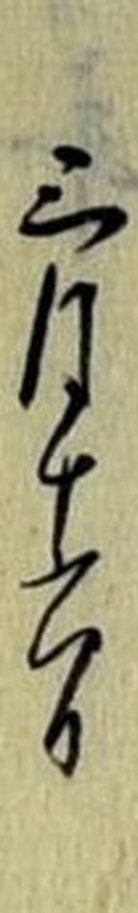三月十六日
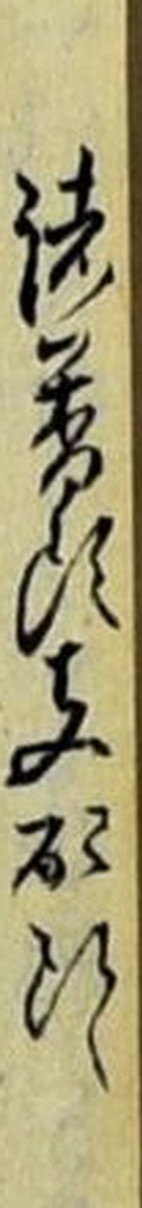諸番頭支配頭へ
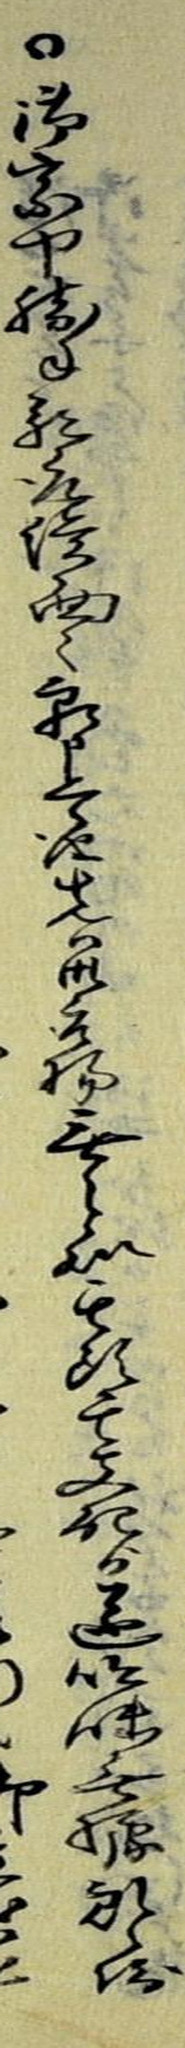〇御家中勝手難取続面々願申上候儀先ハ御取揚無之候処其頭其支配ゟ遂吟味無拠願之儀
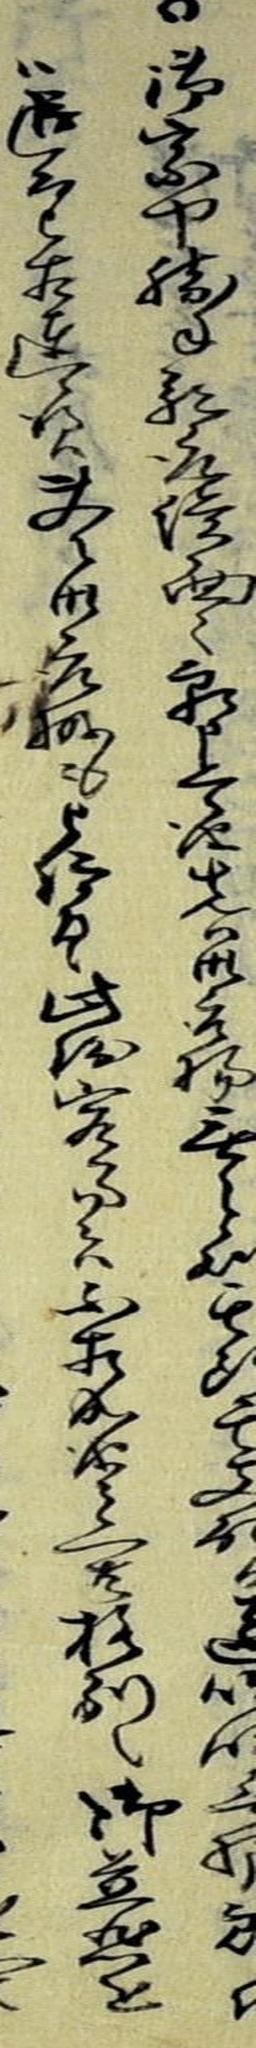ハ追而被相達候得ハ夫々御取扱も被仰付候此儀容易ニハ不相成儀ニ候へ共格別之御慈悲を
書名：命令之部 一
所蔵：福井県文書館 Fukui Prefectural Archives
